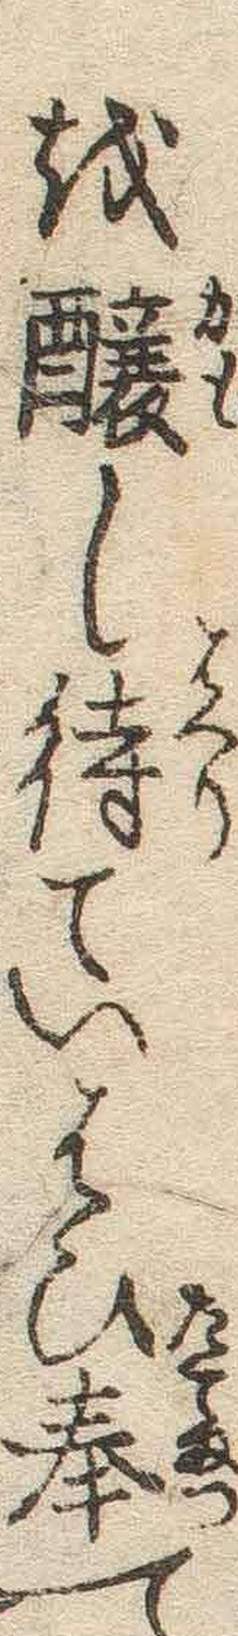を醸し待ていはひ奉
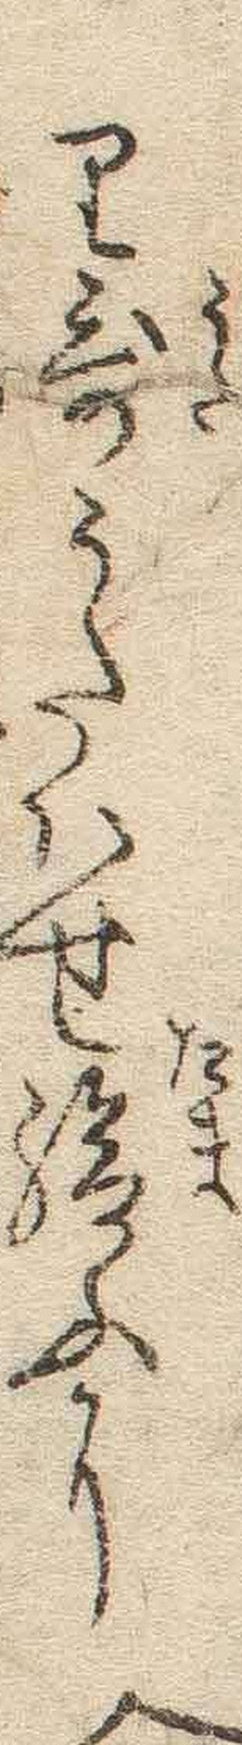り哥うたはせ給ふに
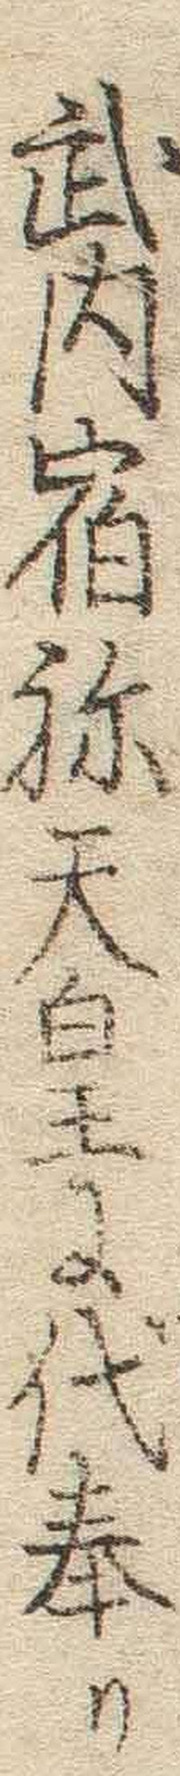武内宿祢天皇に代奉り
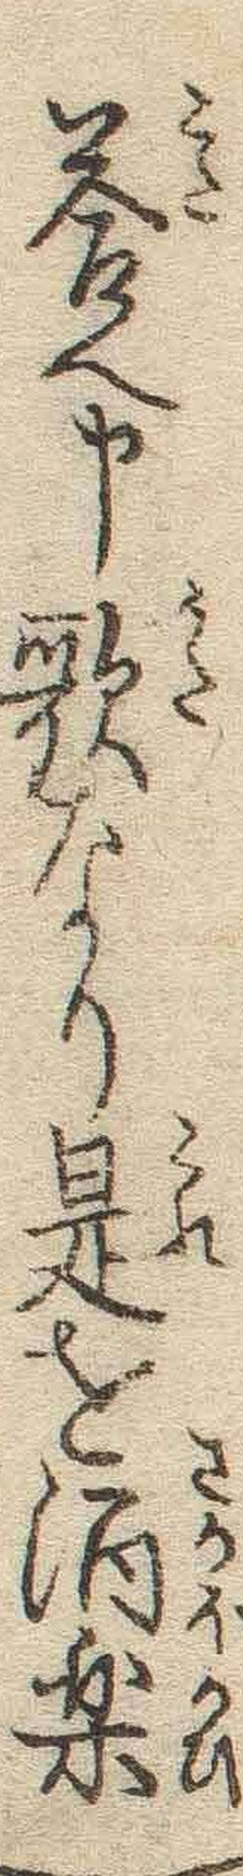答へ申歌なり是を酒楽
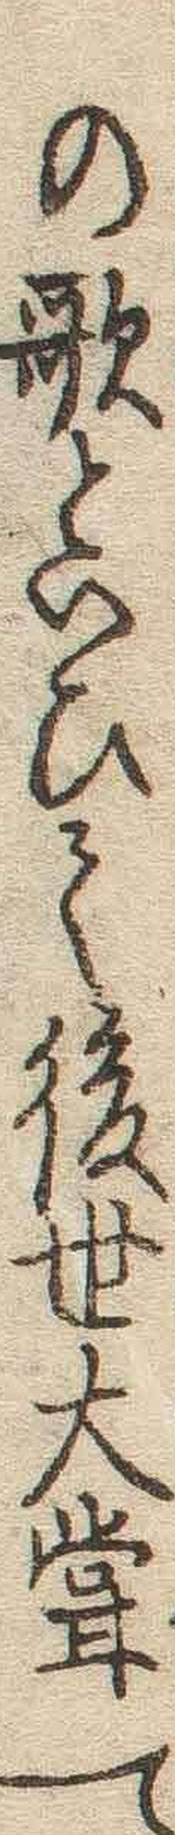の歌といひて後世大嘗
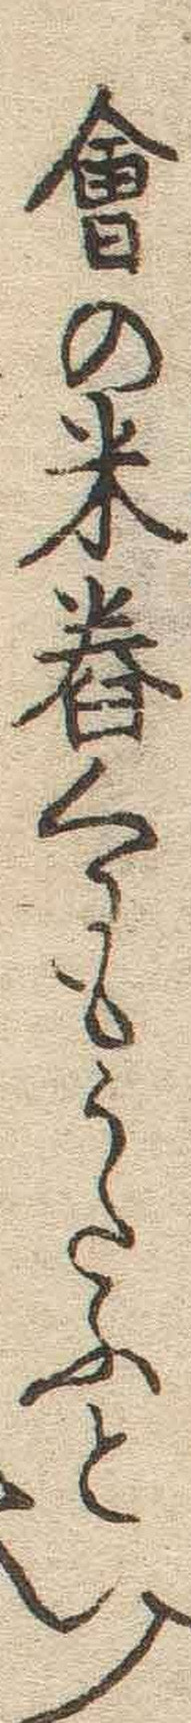会の米舂くにもうたふと也
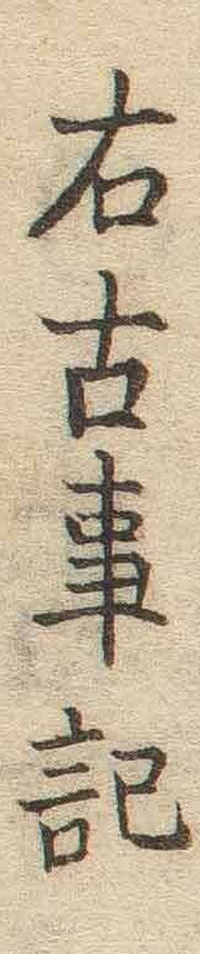右古事記

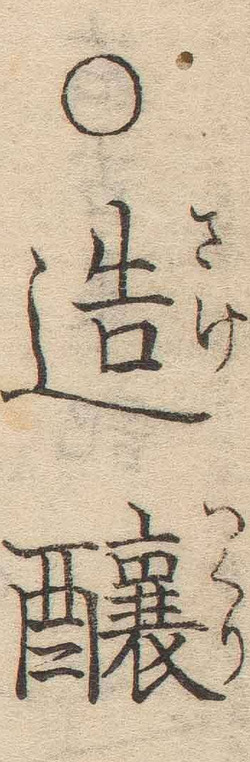○造醸
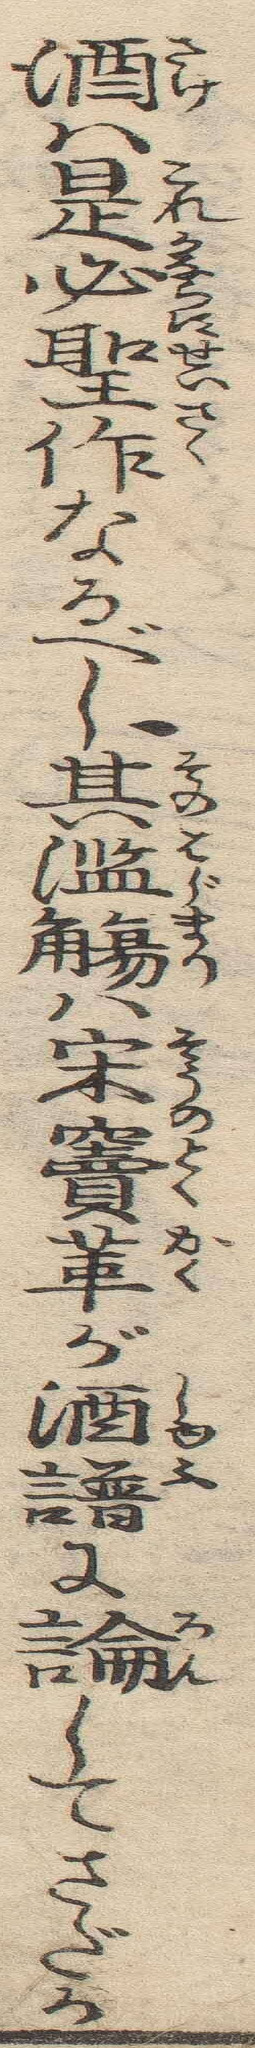酒は是必聖作なるべし。其濫觴は宋竇革が酒譜に論してさだか
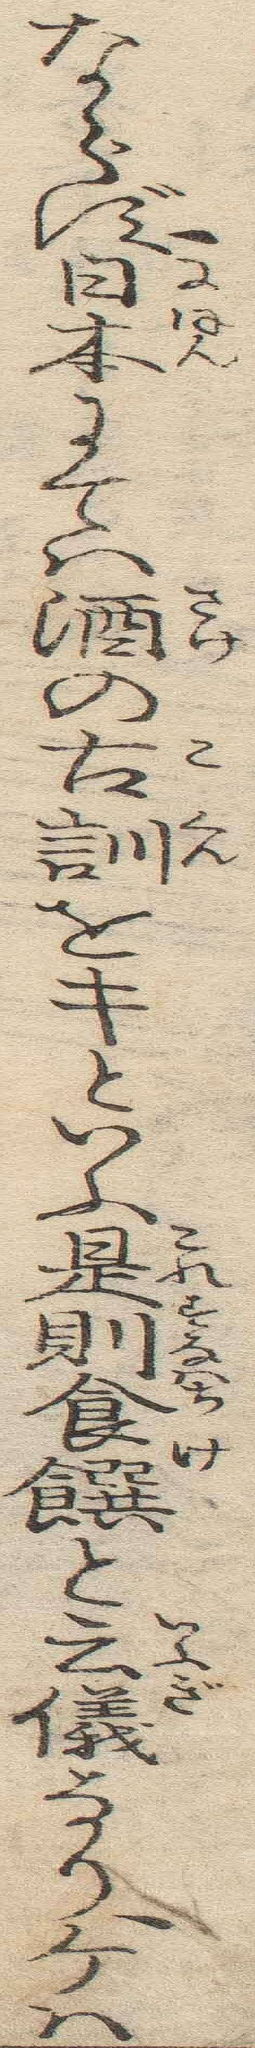ならず。日本にては酒の古訓をキといふ是則食饌と云儀なり。ケは
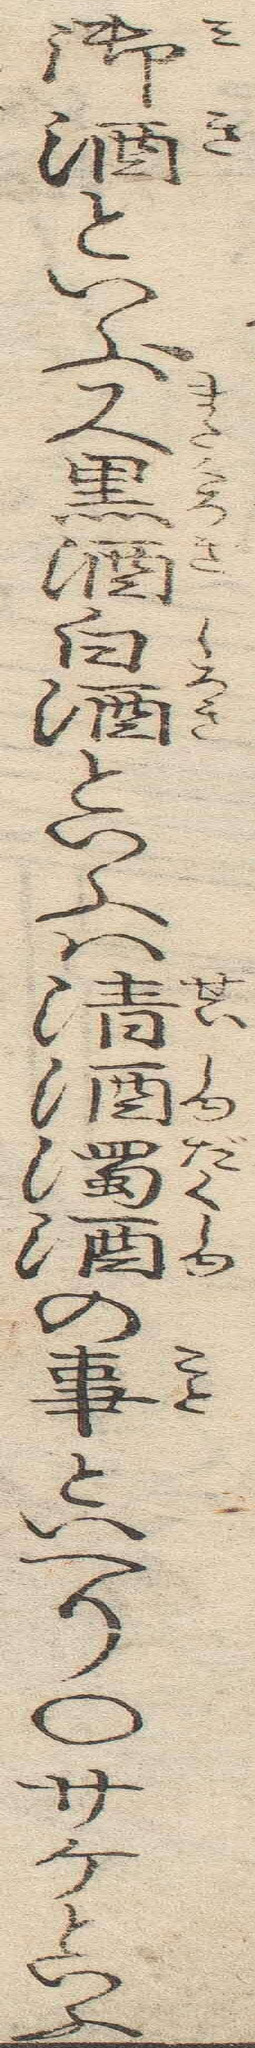御酒といふ。又黒酒白酒といふは清酒濁酒の事といへり○サケといふ
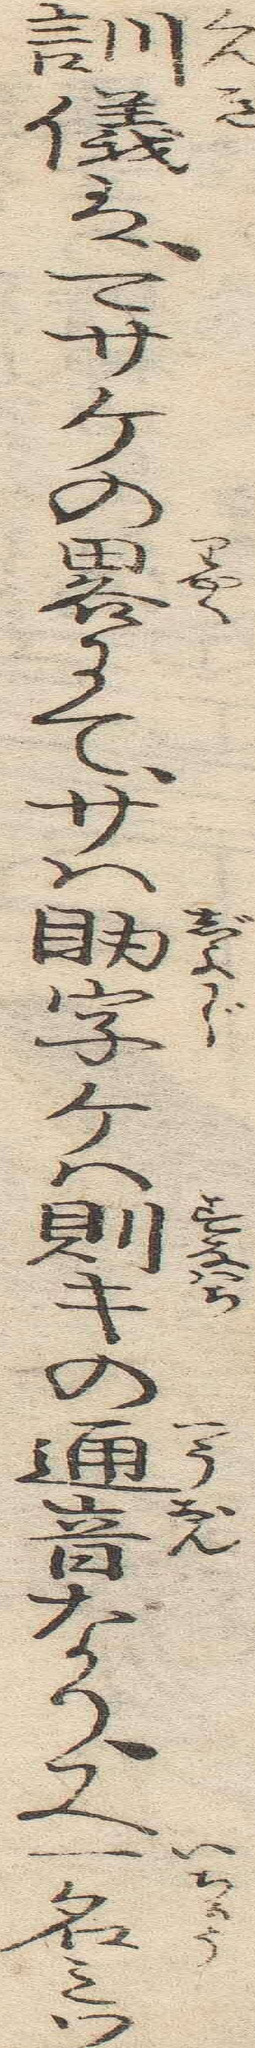訓儀は。てサケの略にて。サは助字ケは則キの通音なり。又一名ミワ
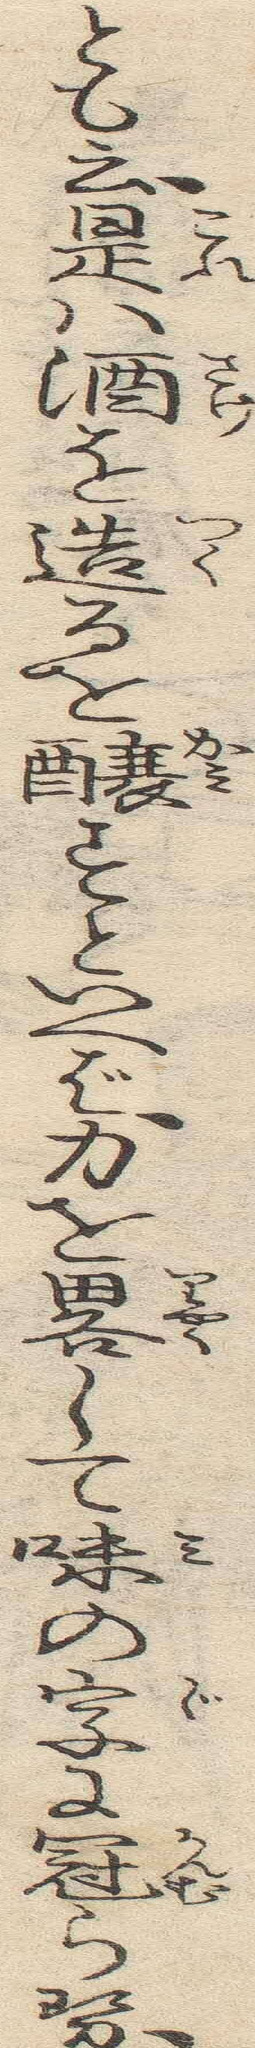とも云。是は酒を造るを醸すといへば。カを略して味の字に冠らせ。
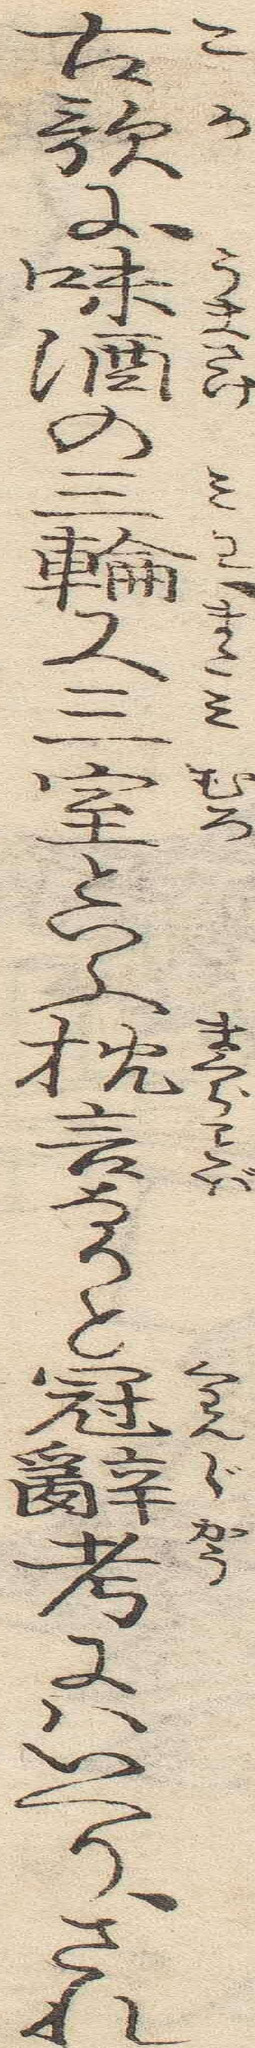古歌に。味酒の三輪。又三室といふ枕言なりと冠辞考にはいへり。され
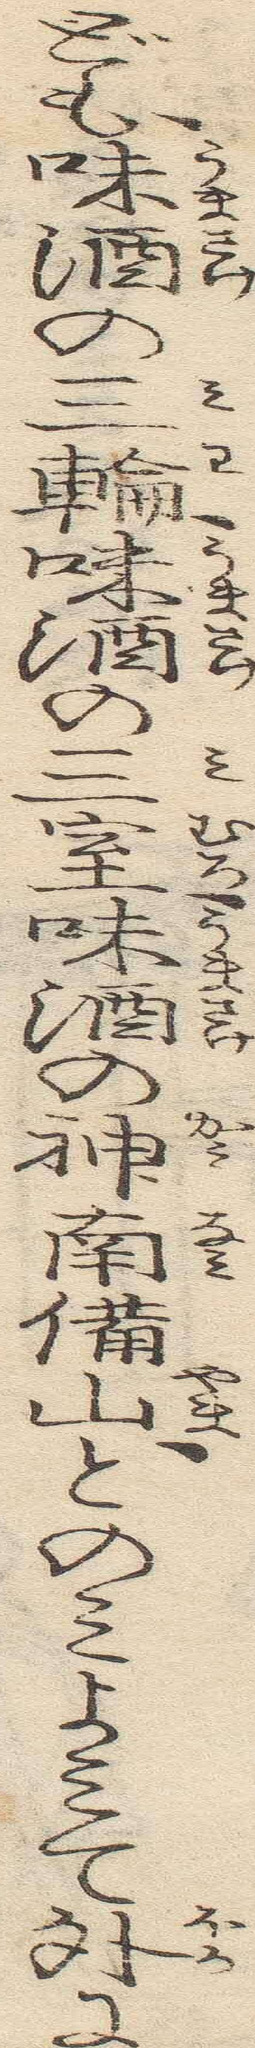ども。味酒の三輪。味酒の三室。味酒の神南備山。とのみよみて外に
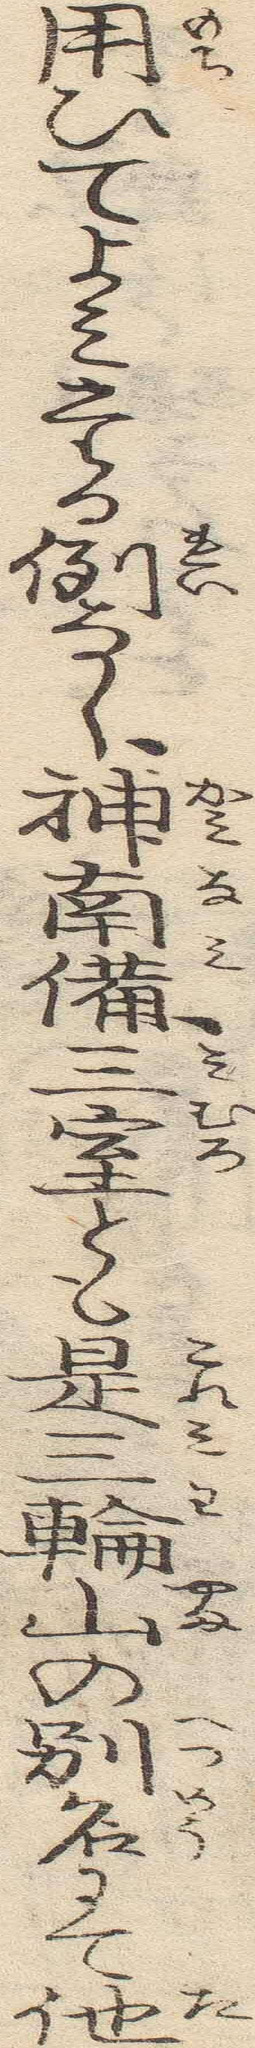用ひてよみたる例なし。神南備。三室とも是三輪山の別名にて他
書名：日本山海名産図会
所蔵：東京学芸大学附属図書館 国文学研究資料館
